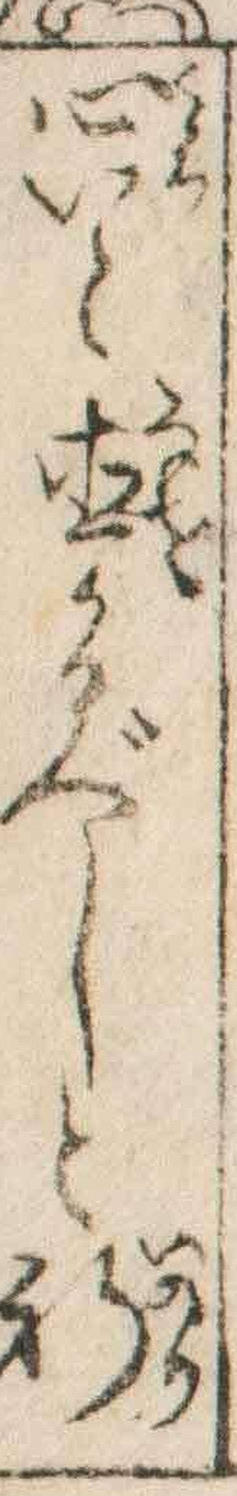心いと直かるべしと祈
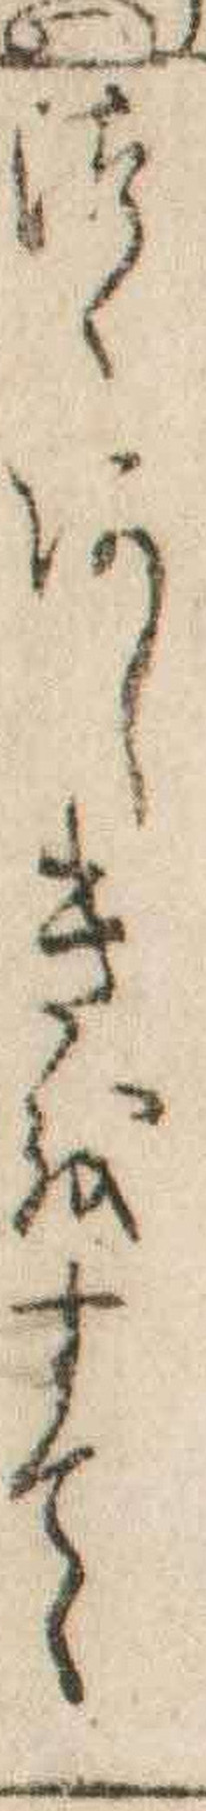信つゝあしきをすてゝ
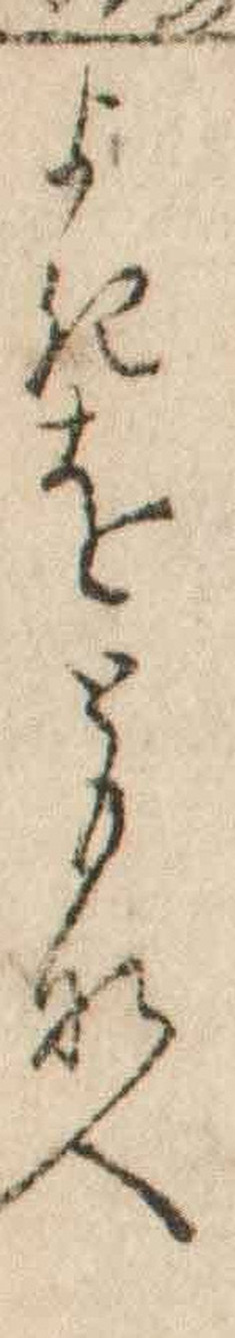よきをともなへ
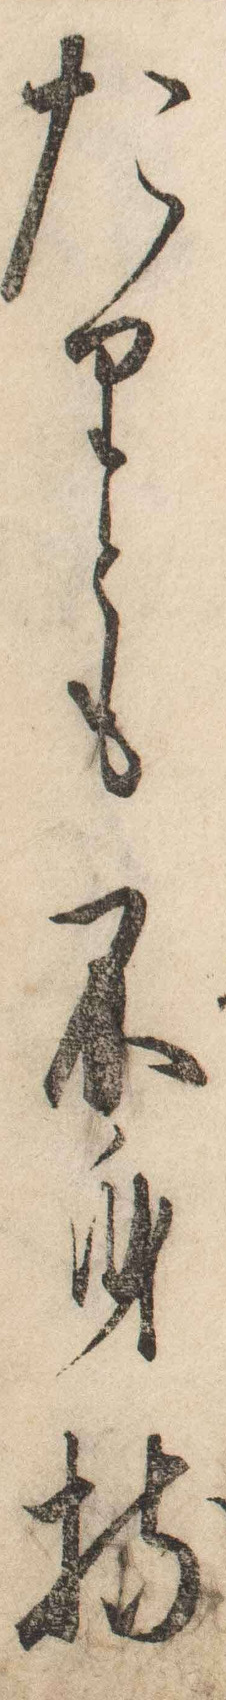たりとも不身持

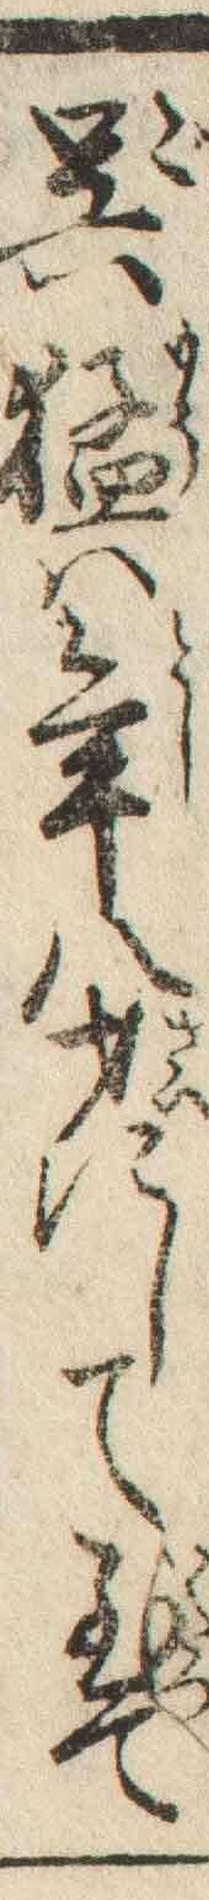呉猛は年八才にして至て
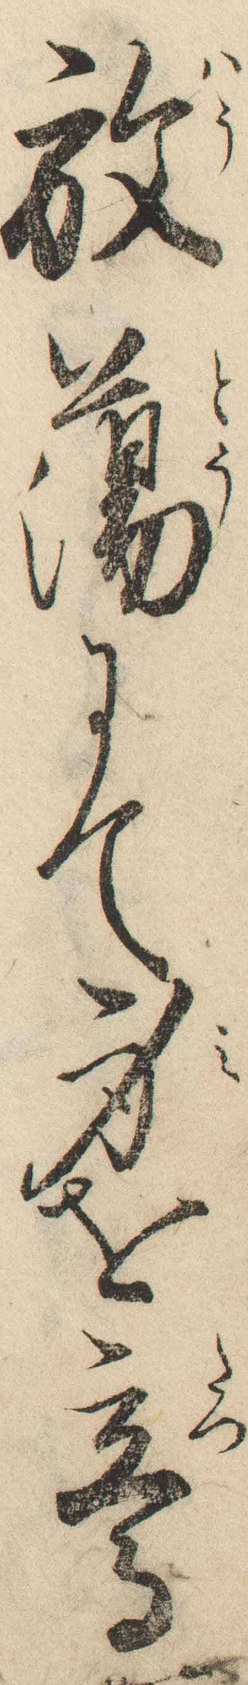放蕩にて身を立る
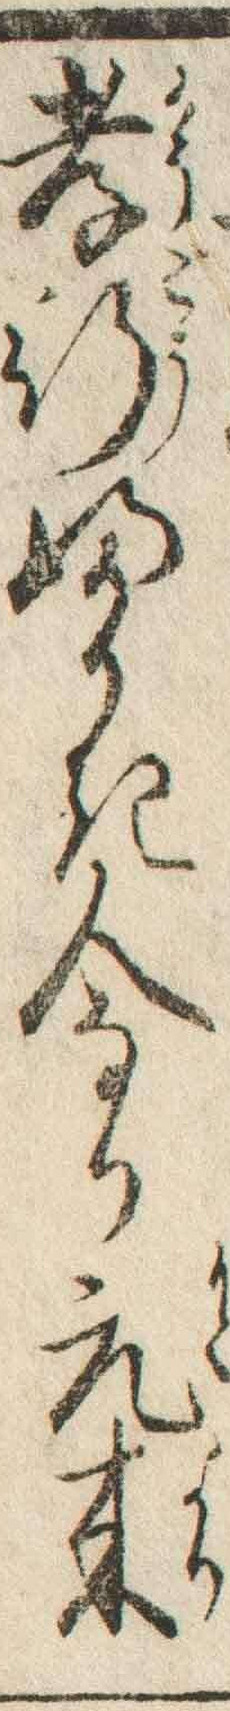孝行ふかき人なり元来
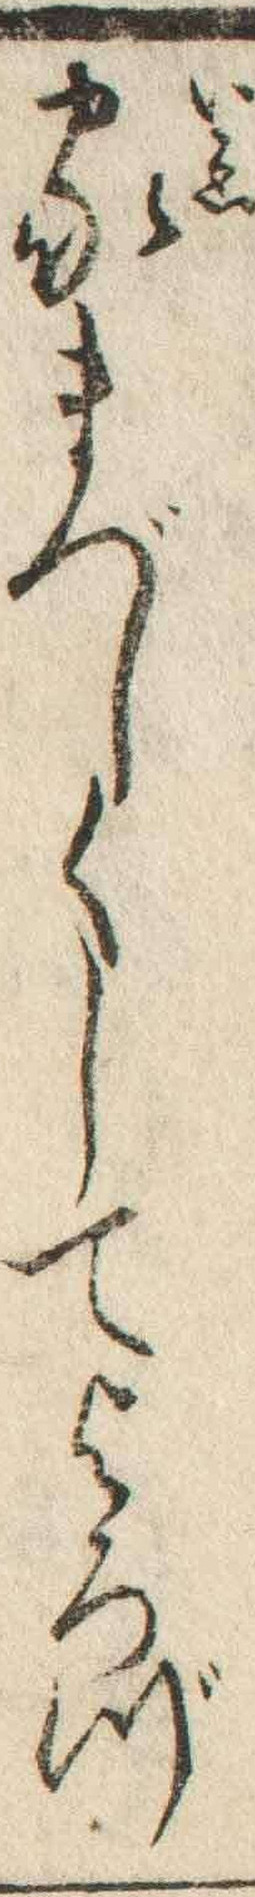家まづしくしてよろづ
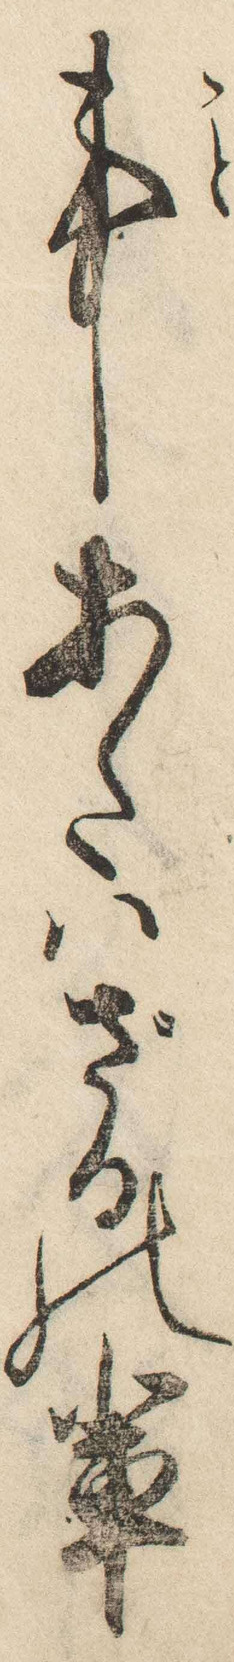事あたはざるの輩
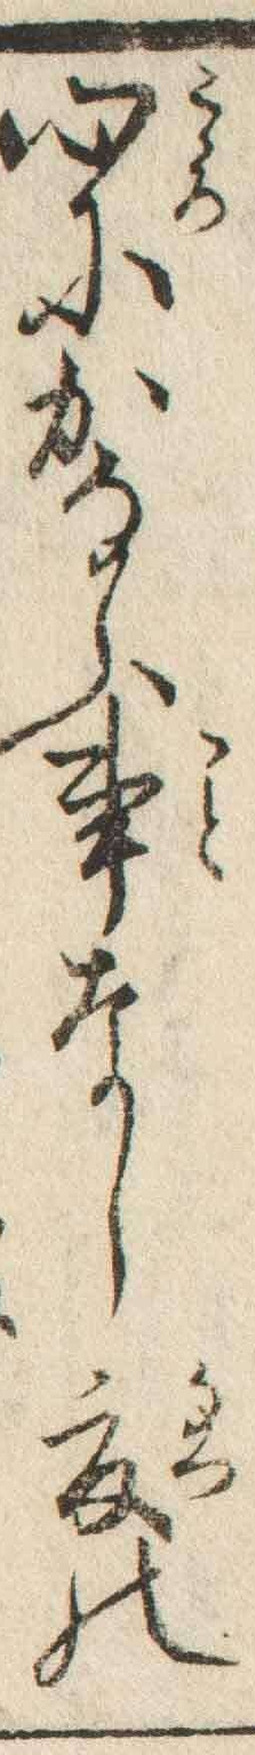心にかなふ事なし夏の
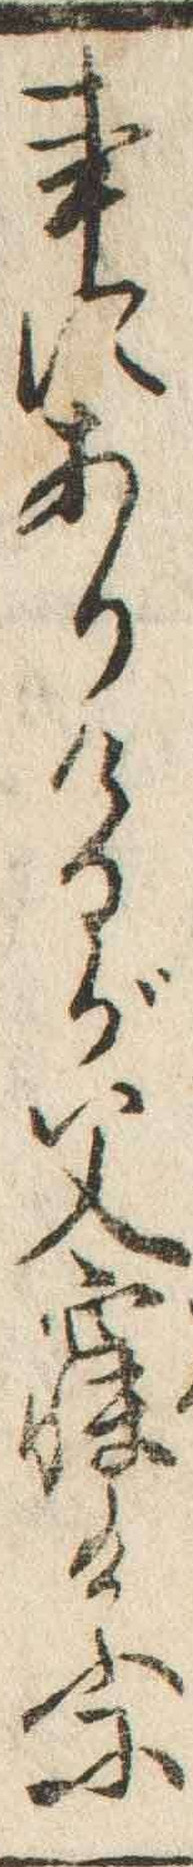事にありけるが父寐給ふに
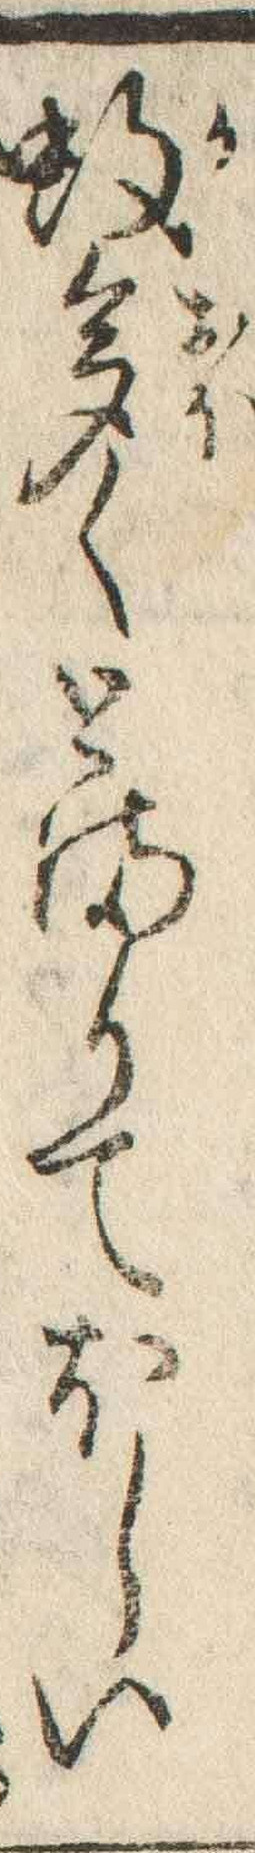蚊多くとまりてほしい
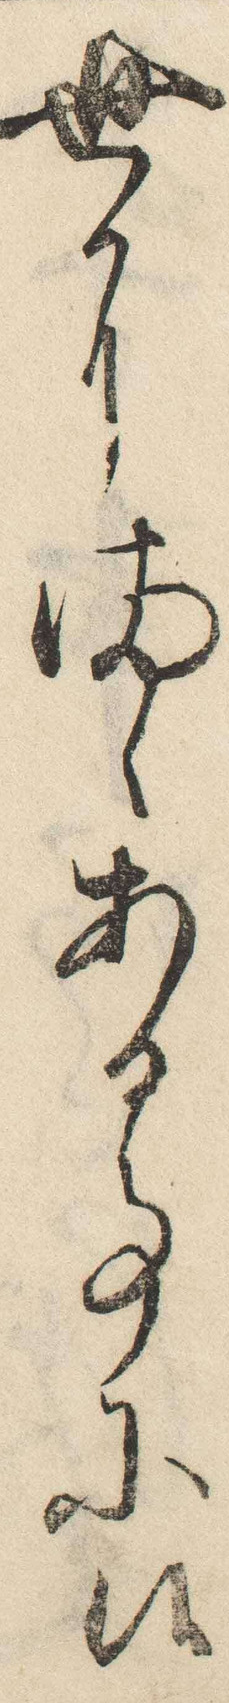世にまゝある事に候
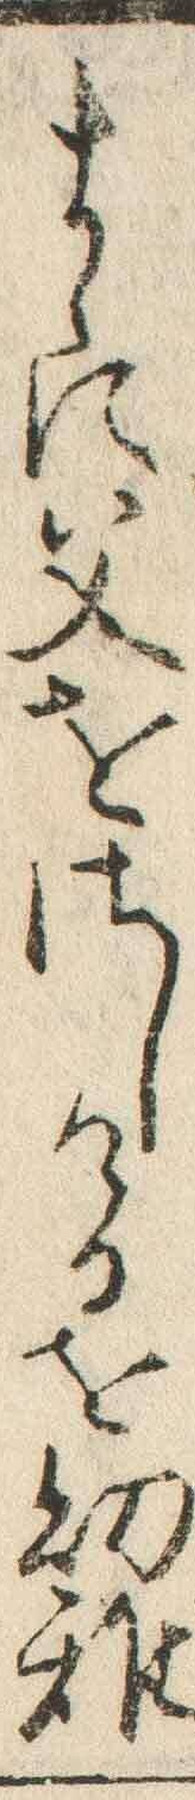まゝに父をさしけるを幼稚
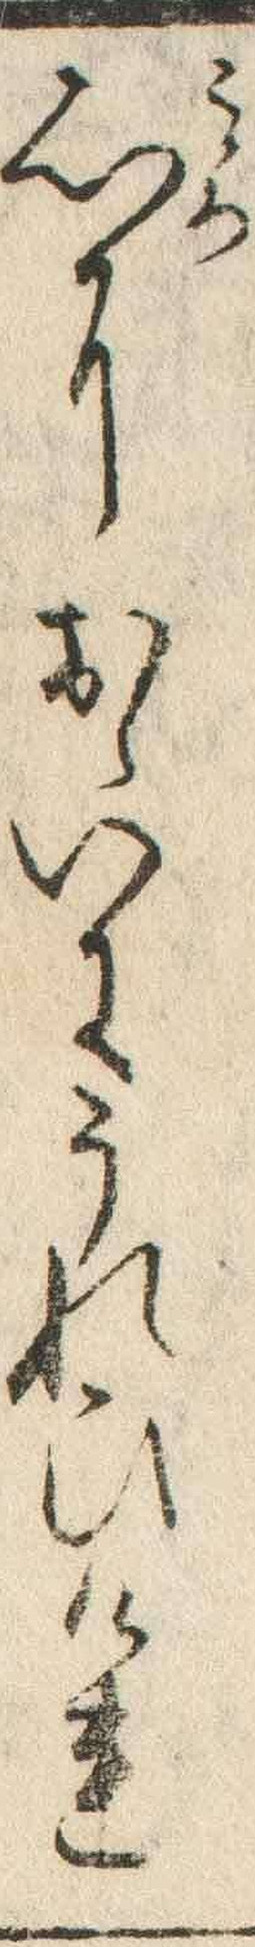心ろにおゝいにうれひけれ
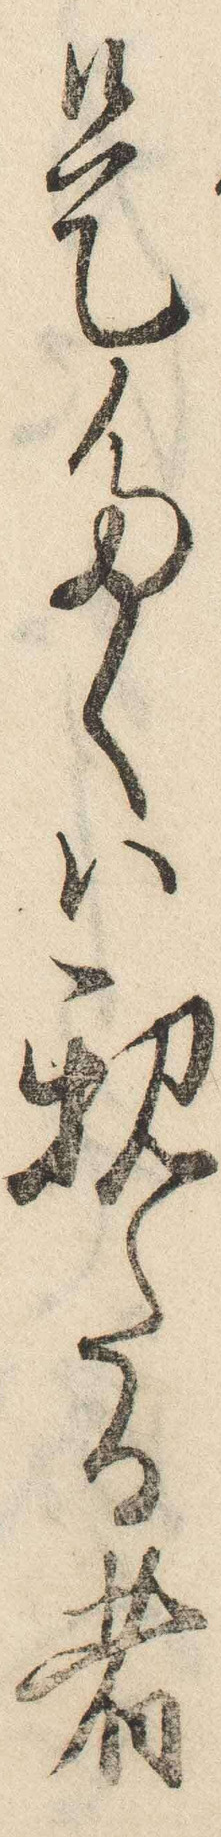是多くは親たる者
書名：撫育草
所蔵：東京学芸大学附属図書館 国文学研究資料館
